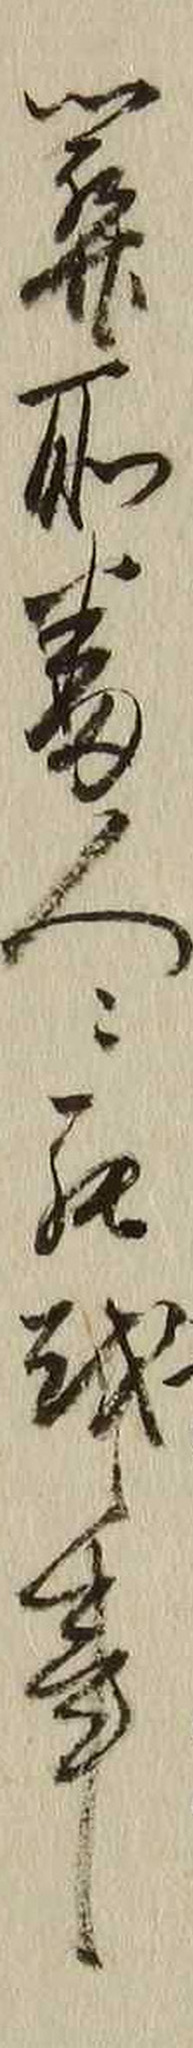関所番人ニ罷越候事
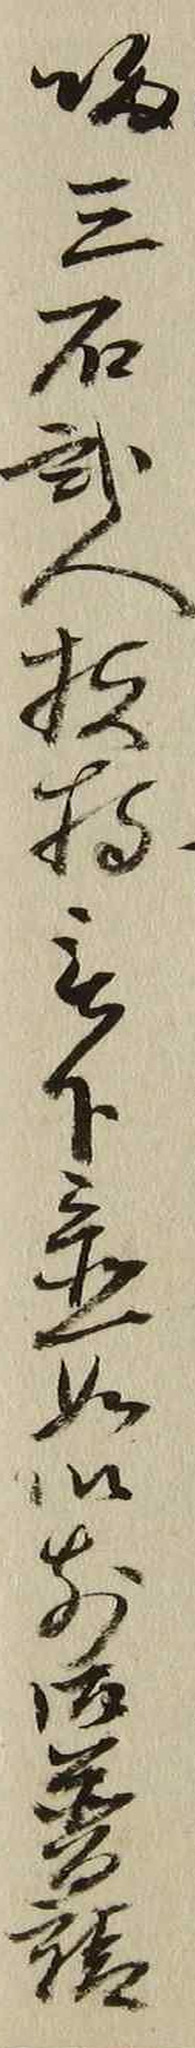帰三石弐人扶持被下置如以前御普請
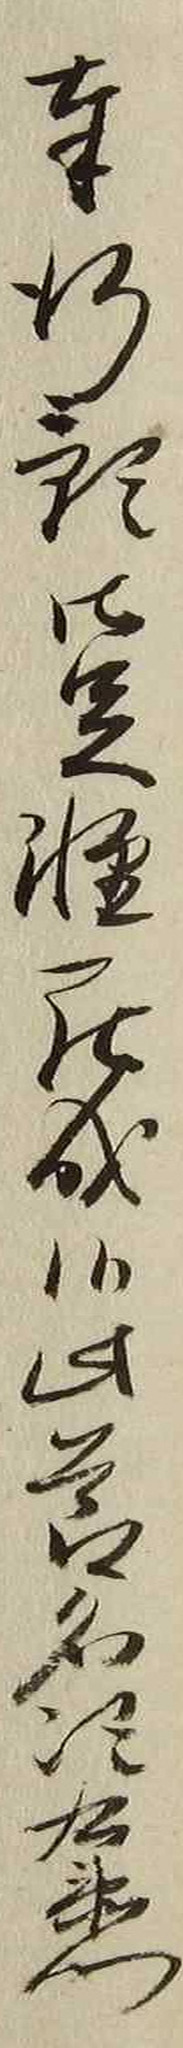奉行預御足軽罷成候此節名次右衛門
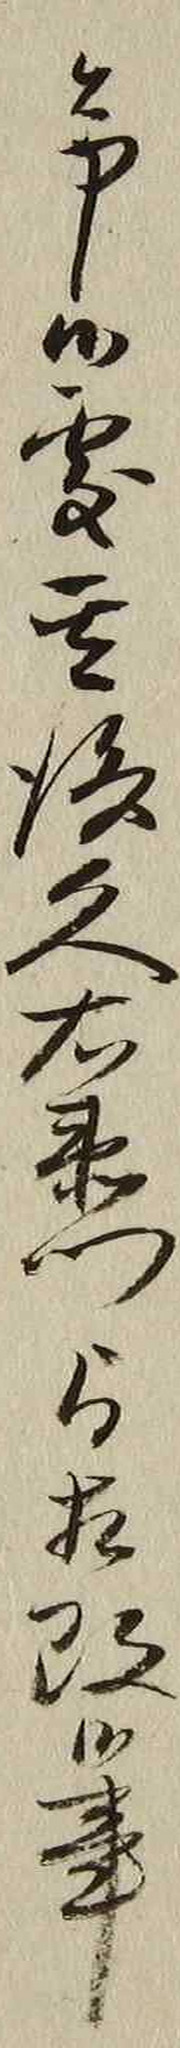と申候処其後久右衛門与相改候事
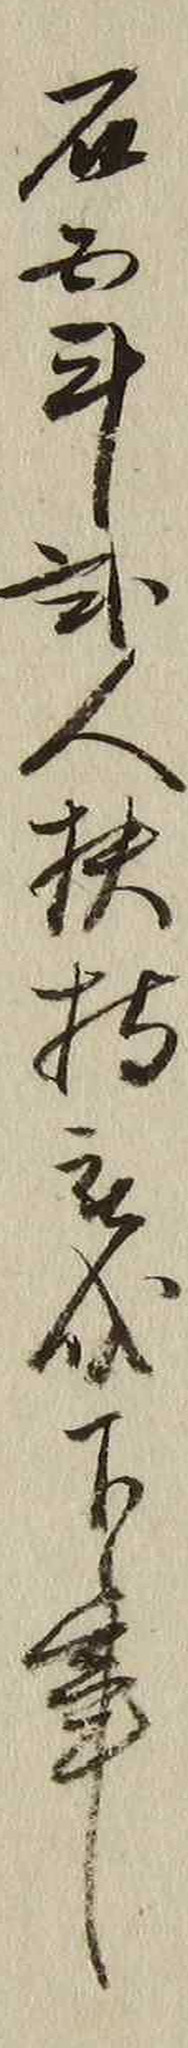石五斗弐人扶持被成下候事
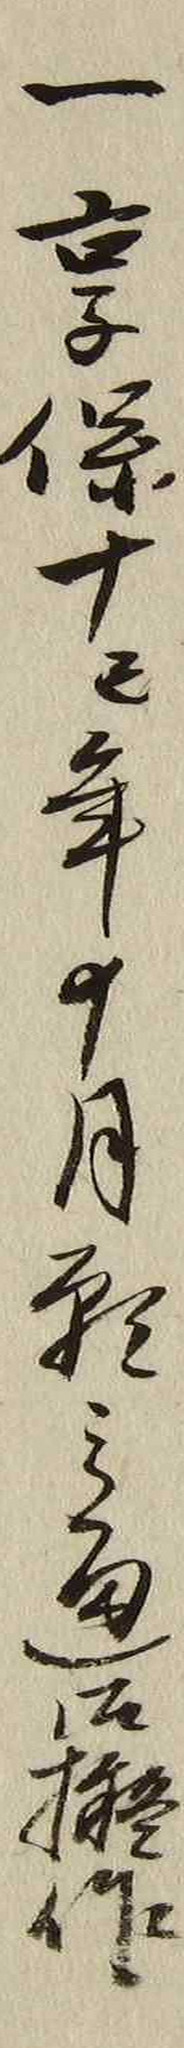一享保十巳年十月願之通御擬作
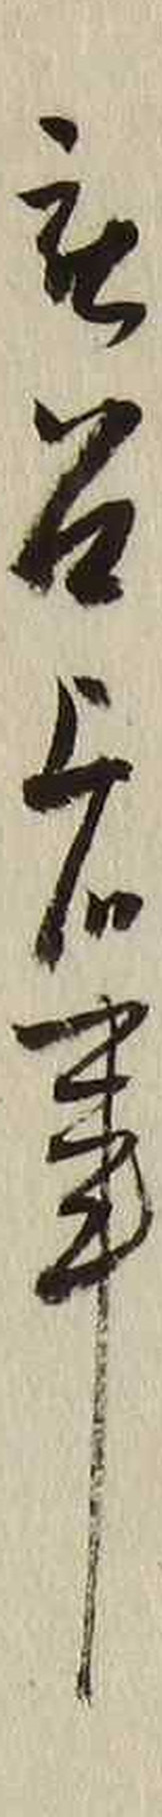被召上候事
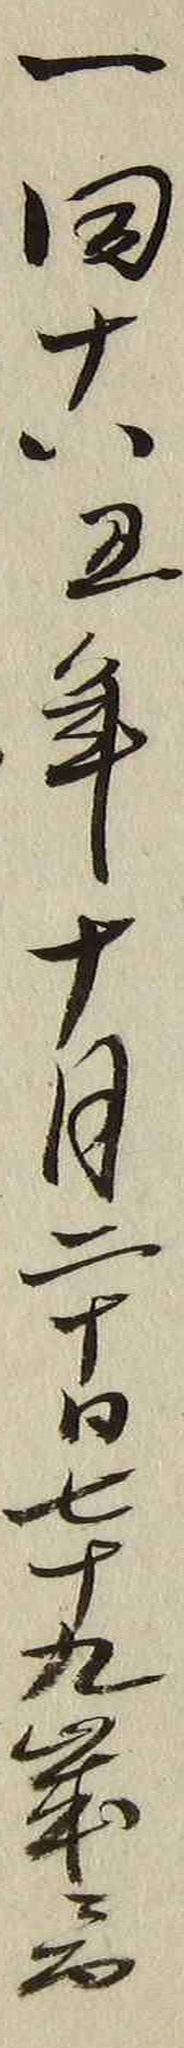一同十八丑年十月二十日七十九歳ニ而
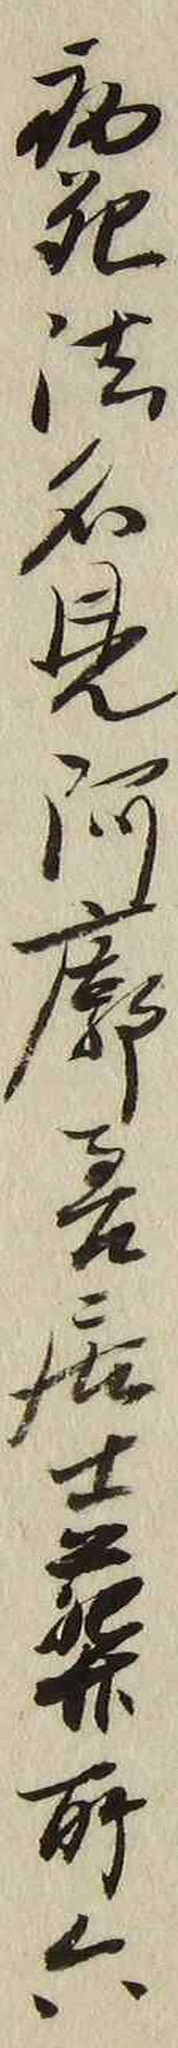病死法名見阿廓善居士葬所六
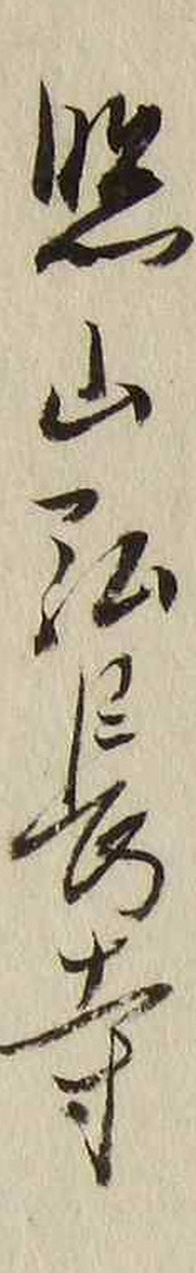照山弘長寺

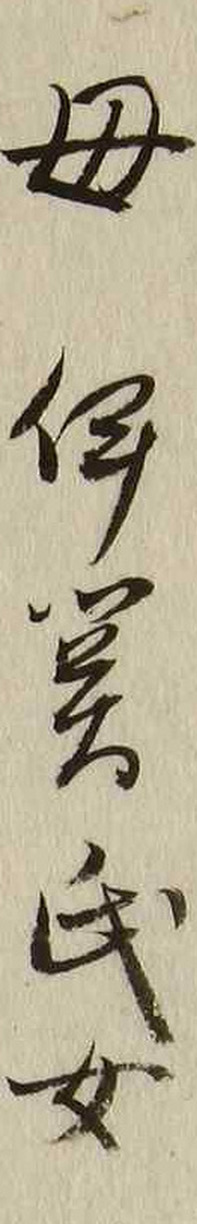母伊関氏女
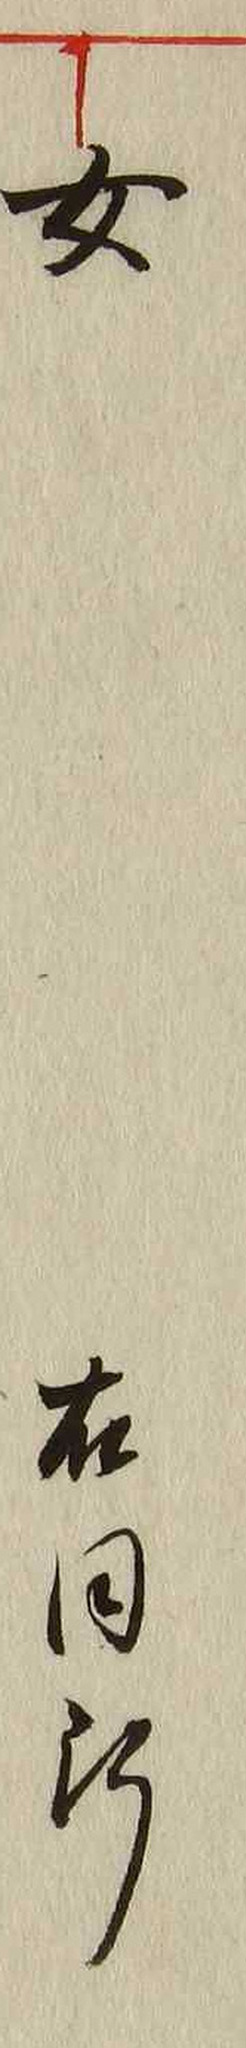女右同断
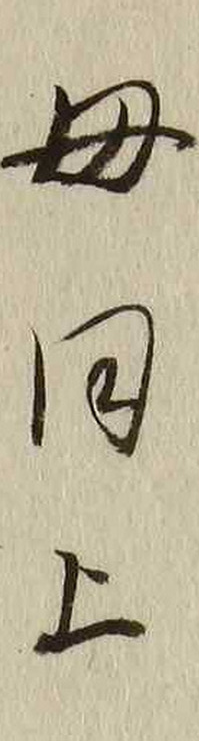母同上
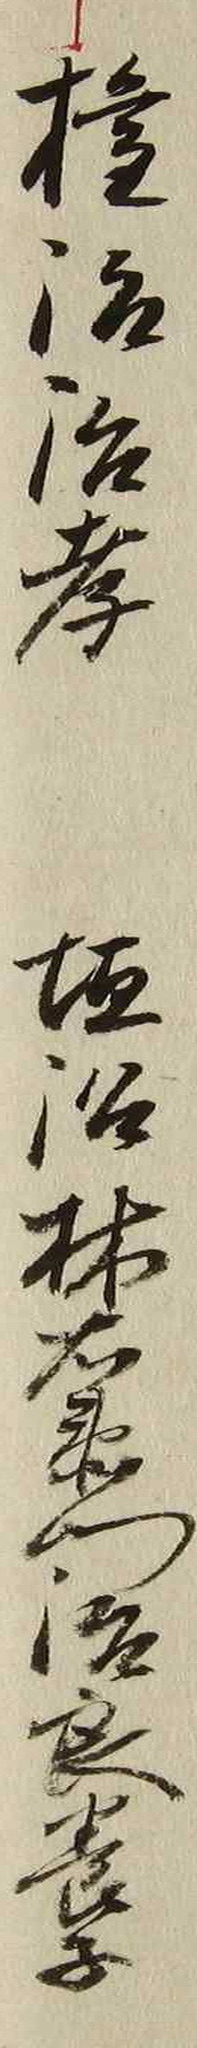権治治孝垣沼林右衛門治良養子
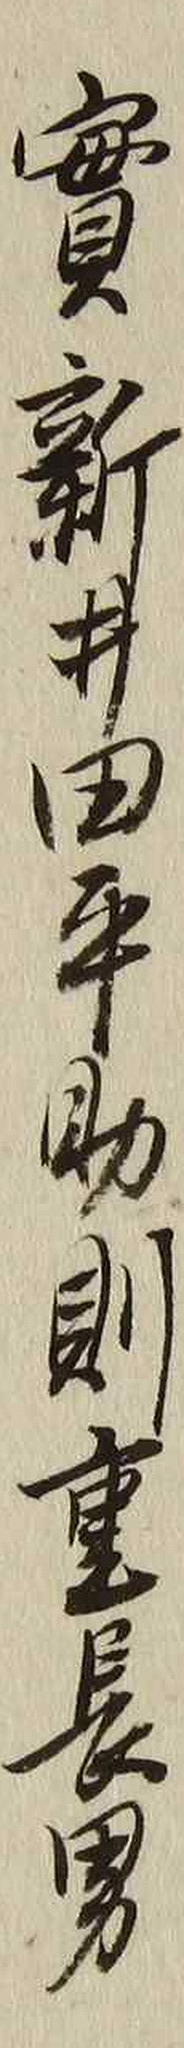実新井田平助則重長男
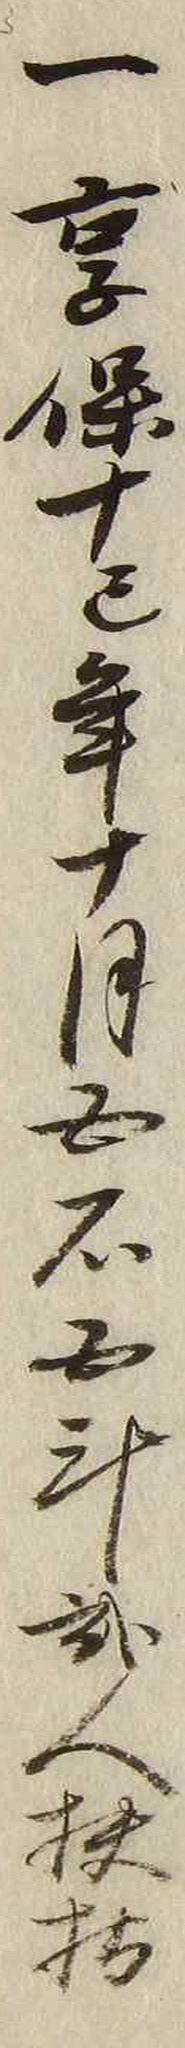一享保十巳年十月五石五斗弐人扶持
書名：諸士系譜　巻之352　す之部2
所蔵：会津若松市立会津図書館
